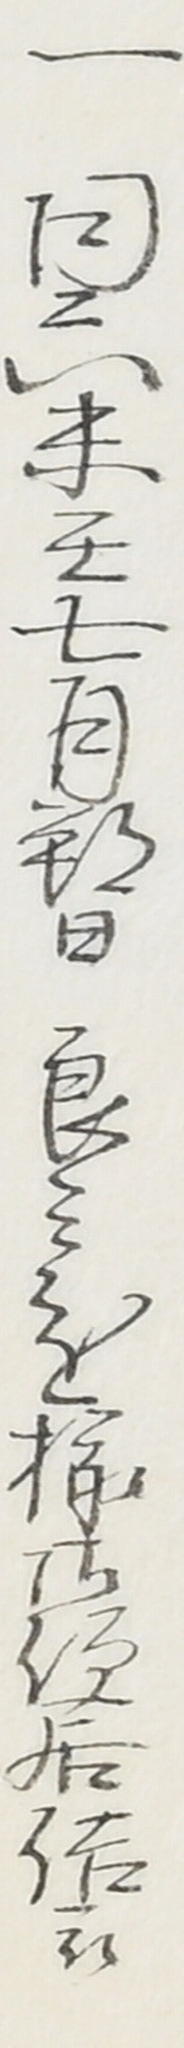一同六未閏七月朔日良之進御住居詰被
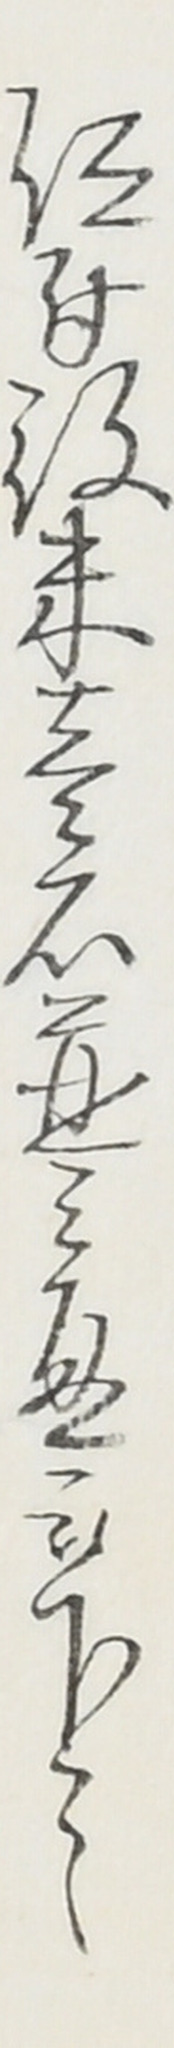仰付役米壱石並之通被下之
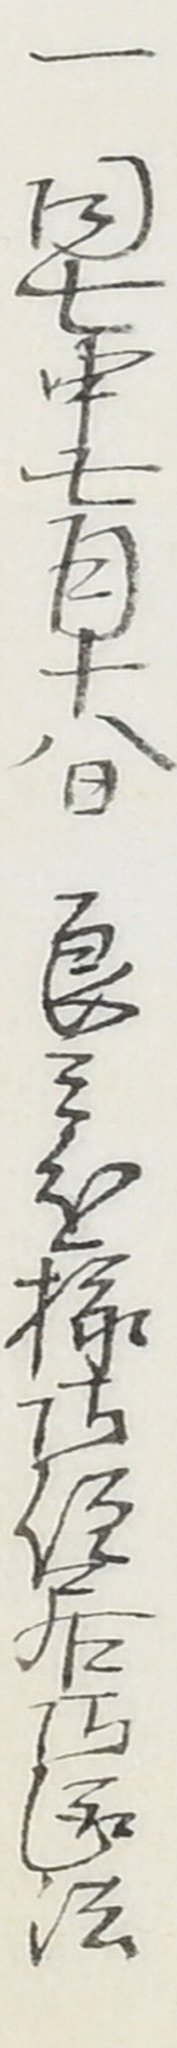一同七申七月十八日良之進様御住居御趣法
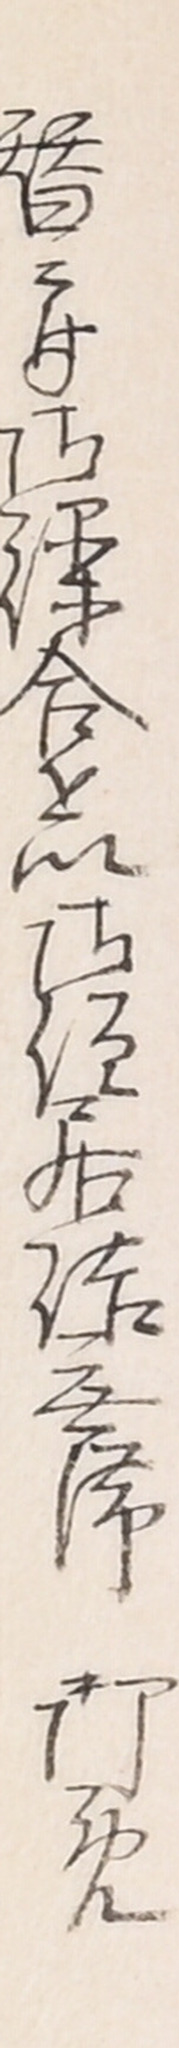替ニ付御繰合を以御住居詰無滞御免
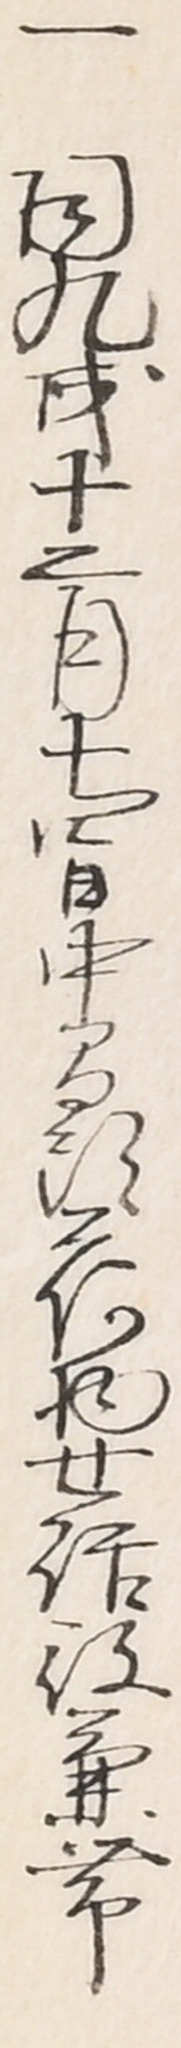一同九戌十二月十四日中間頭荷物世話役兼帯
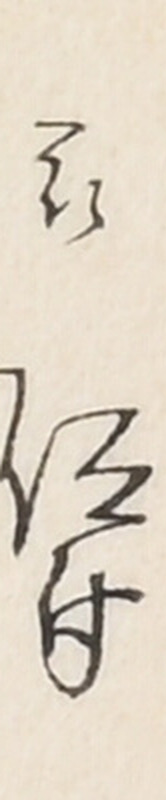被仰付
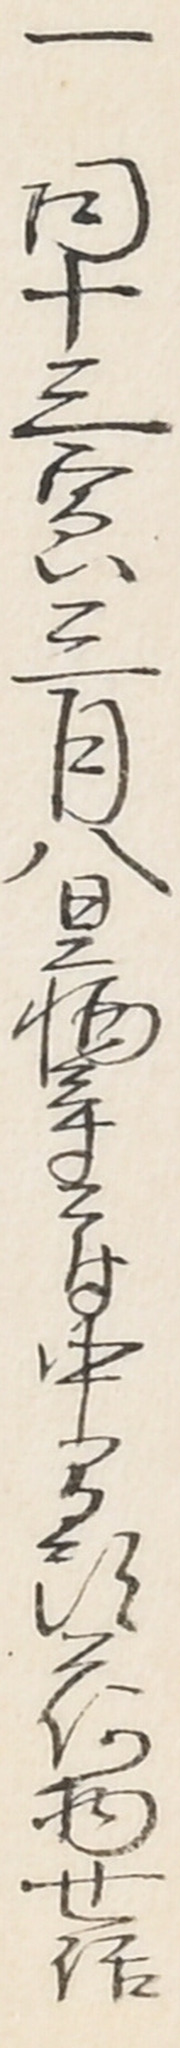一同十三寅三月八日病気ニ付中間頭荷物世話
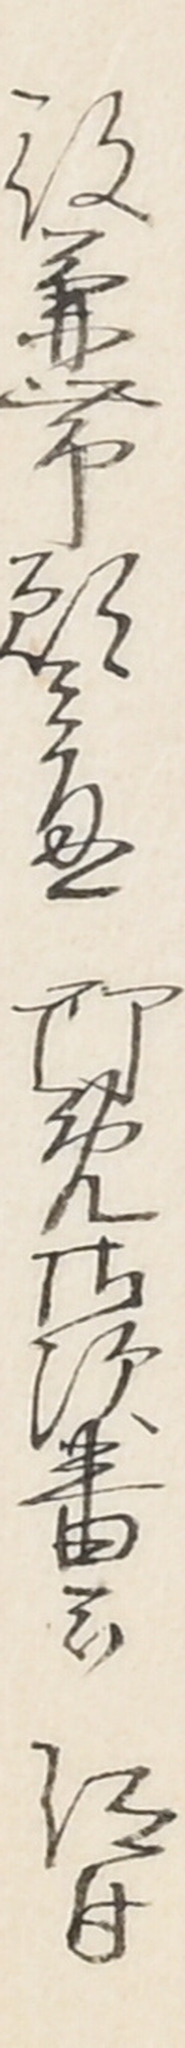役兼帯願之通御免御次番被仰付
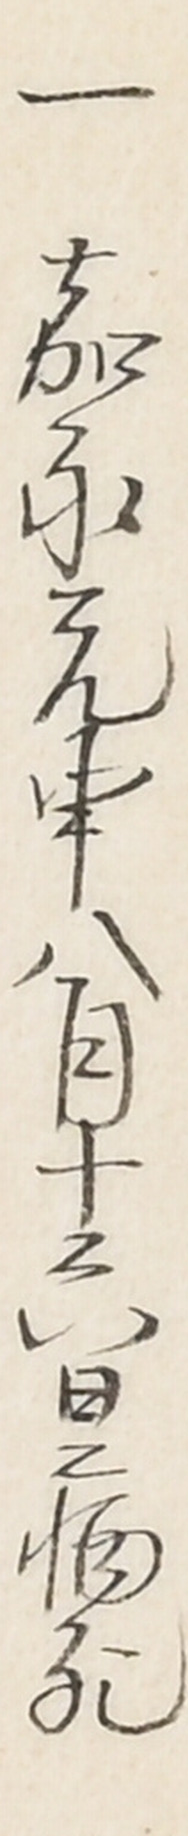一嘉永元申八月十六日病死
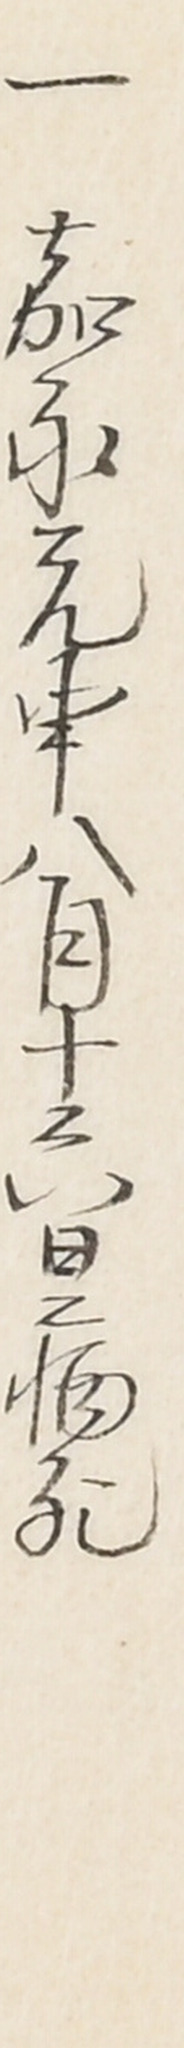一嘉永元申八月十六日病死

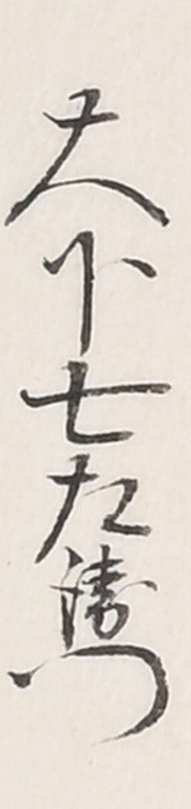大下七左衛門
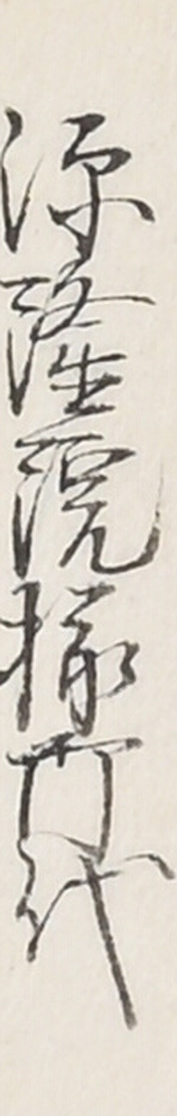源隆院様御代
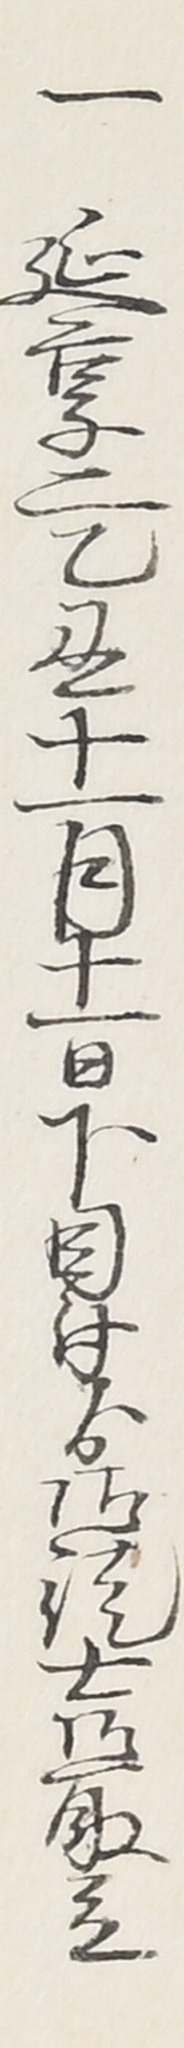一延享二乙丑十一月十一日下目付ゟ御徒士御取立
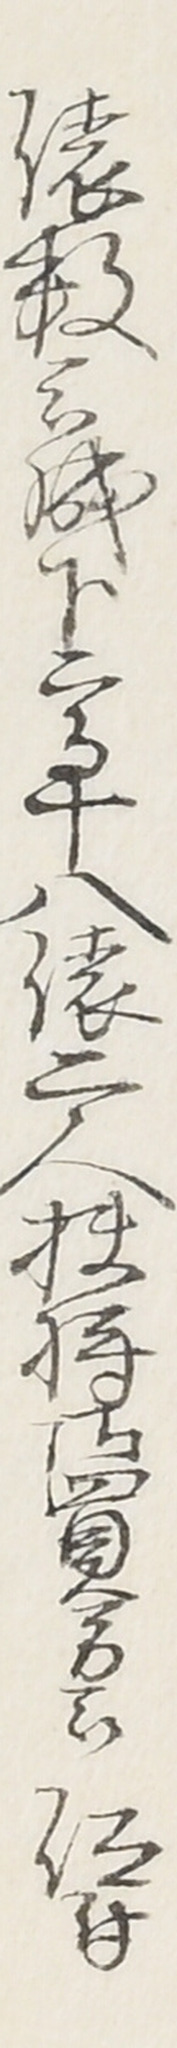俵数被成下高十八俵二人扶持御買方被仰付
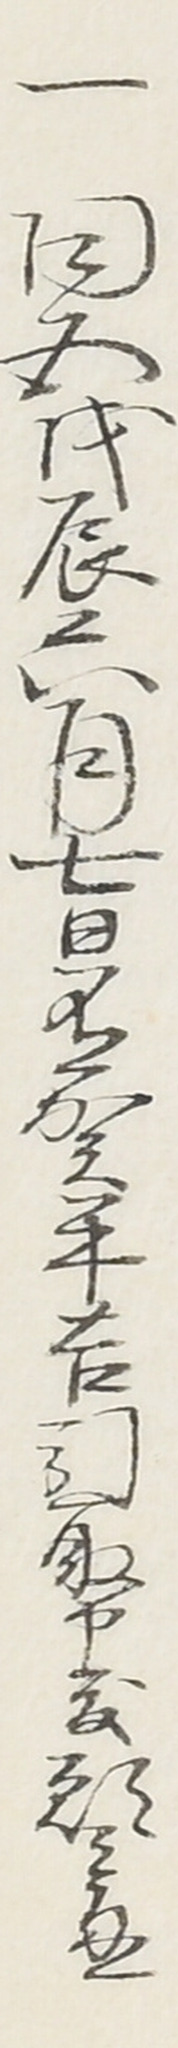一同五戊辰六月七日有賀平吉引取申度願之通
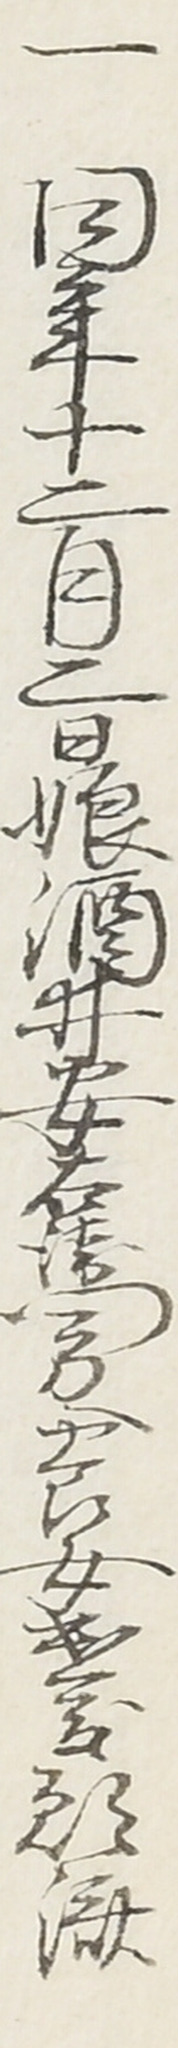一同年十二月二日娘酒井安右衛門方養女遣度願済
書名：無足諸士勤仕録（四）
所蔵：伊那市立高遠町図書館・合同会社AMANE
